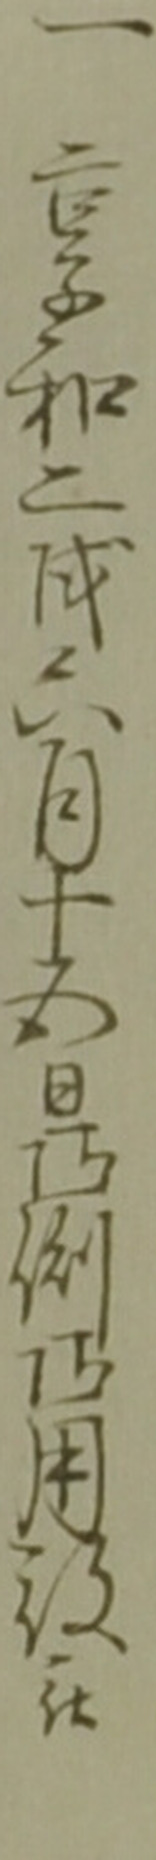一享和二戌六月十五日御側御用役被
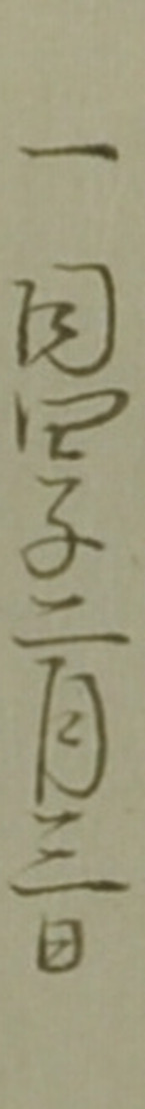一同四子二月三日
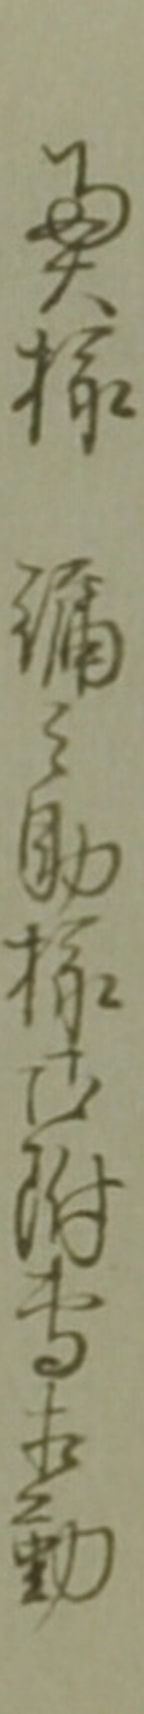奥様鏞之助様御附専相勤
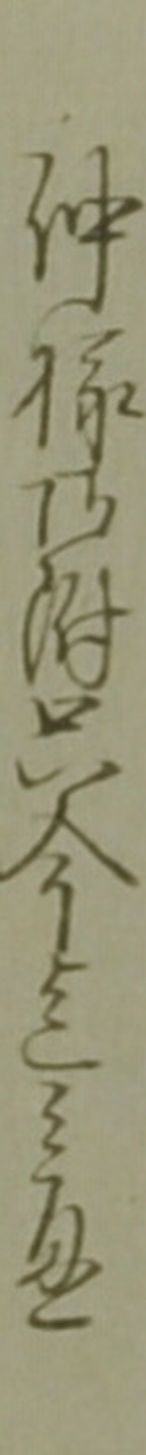仲様御附只今迄之通
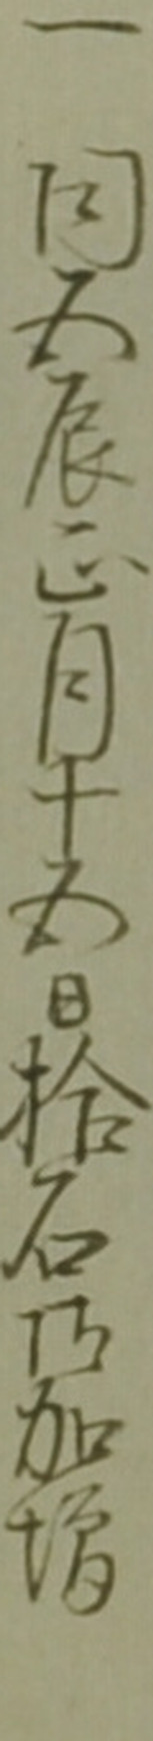一同五辰正月十五日拾石御加増
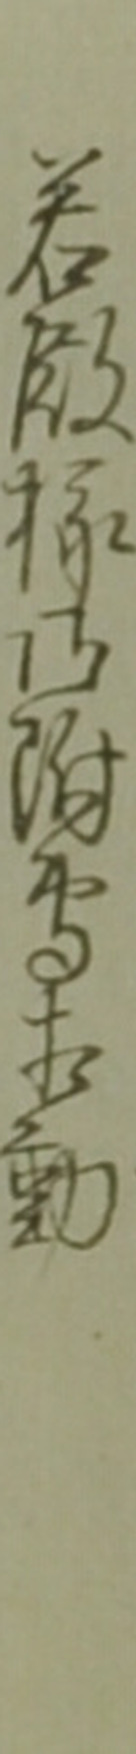若殿様御附専相勤
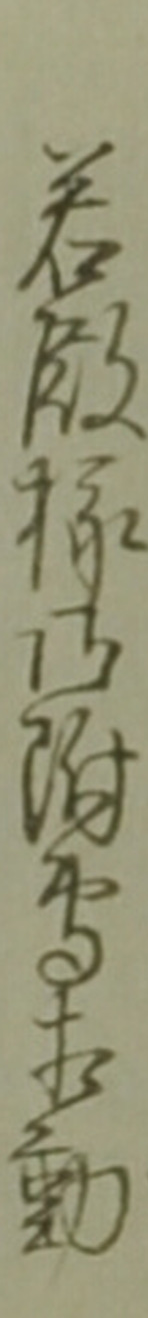若殿様御附専相勤
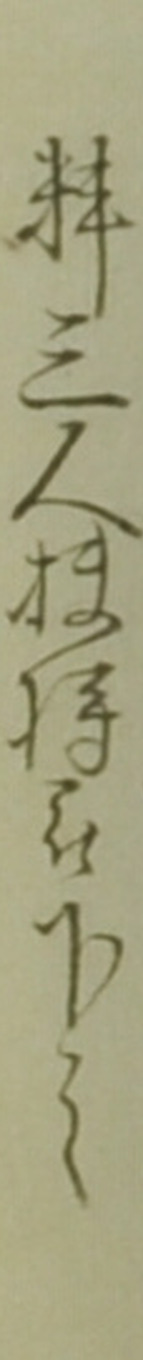料三人扶持被下之
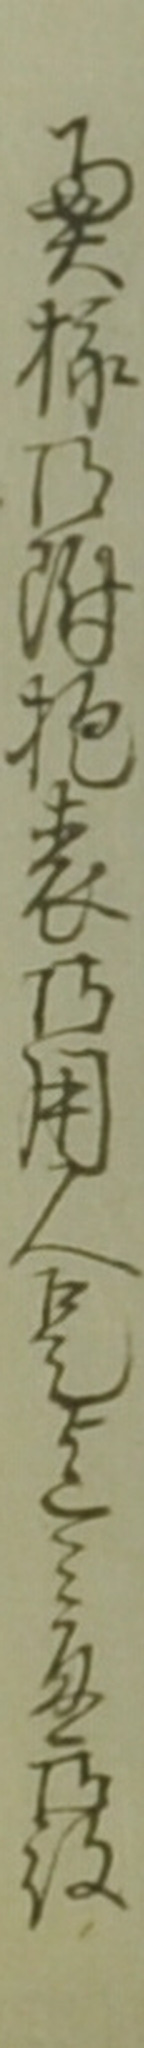奥様御附抱表御用人是迄之通御役

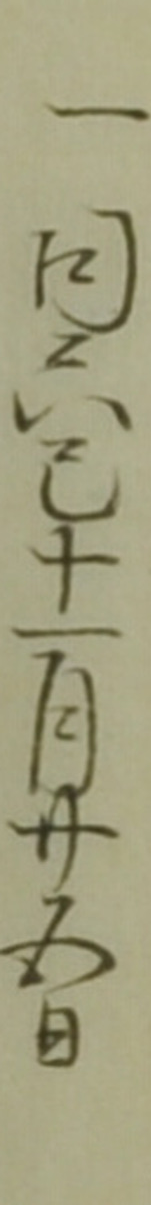一同六巳十一月廿五日
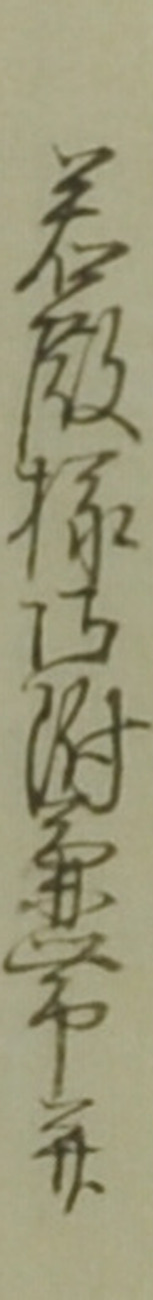若殿様御附兼帯并
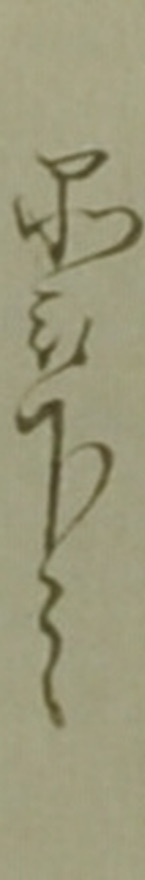品被下之
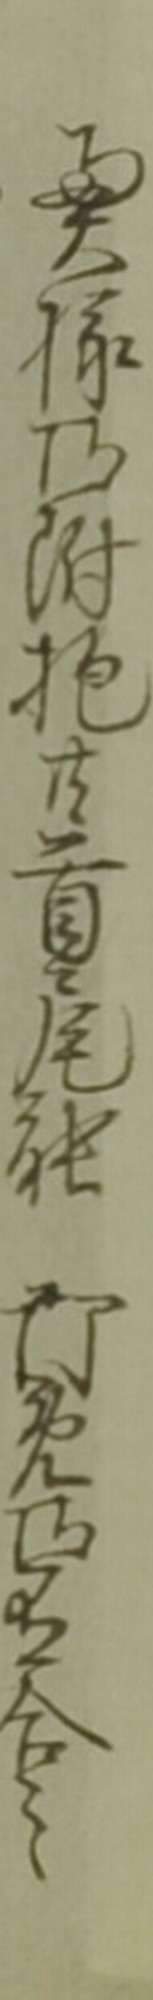奥様御附抱共首尾能御免御有合之
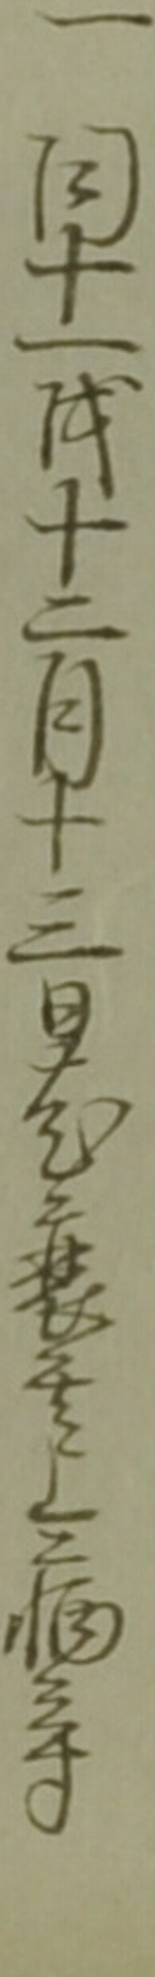一同十一戌十二月十三日老衰其上病気
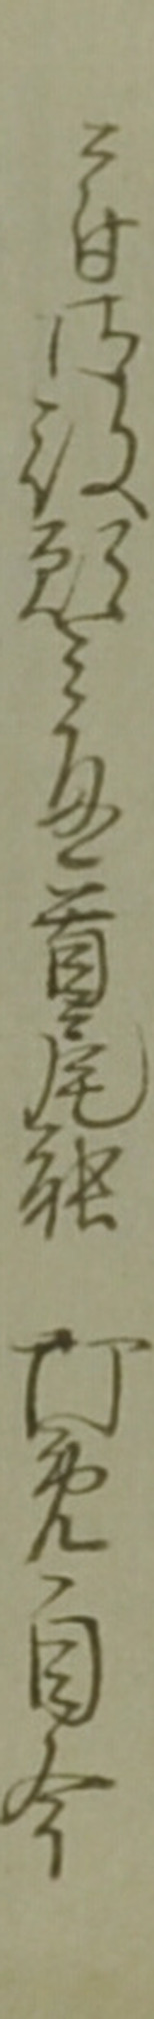ニ付御役願之通首尾能御免自今
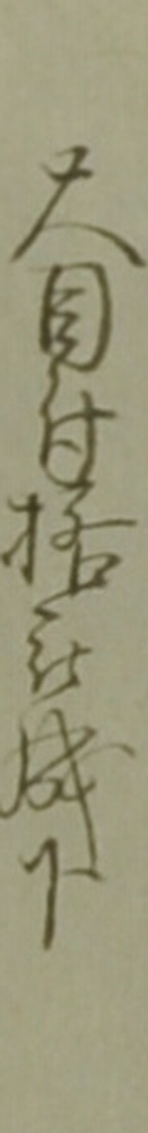大目付格被成下
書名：給人諸士勤仕録（三）
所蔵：伊那市立高遠町図書館・合同会社AMANE
